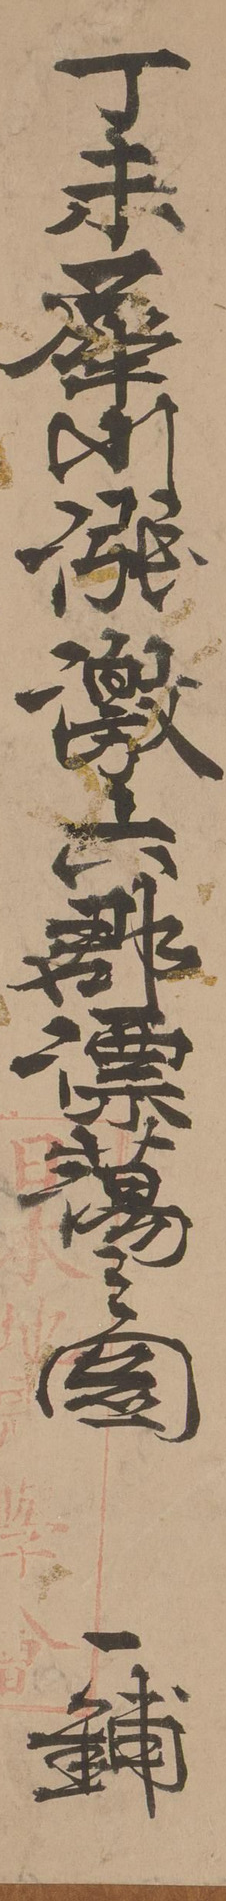丁未犀川漲激六郡漂蕩之圖一鋪

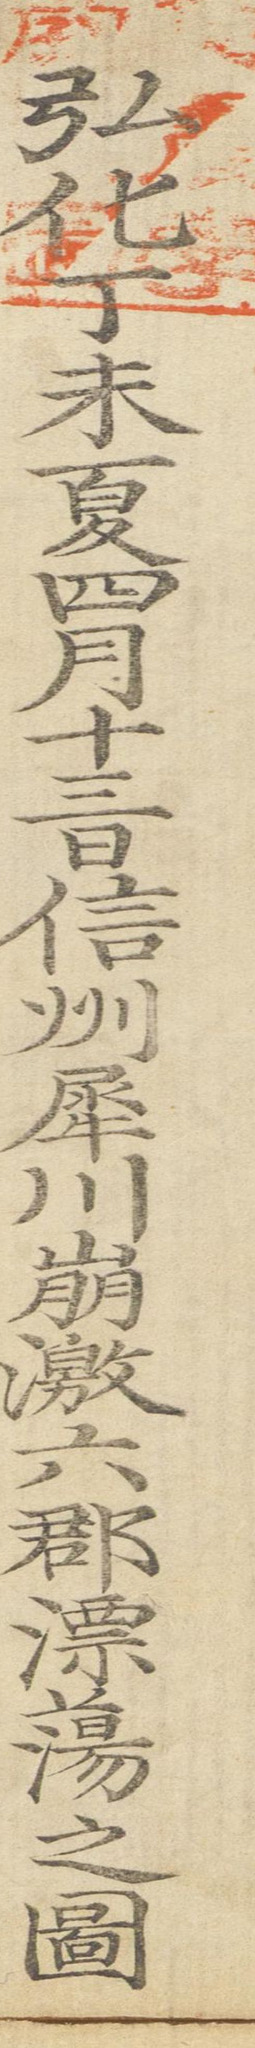弘化丁未夏四月十三日信州犀川崩激六郡漂蕩之圖
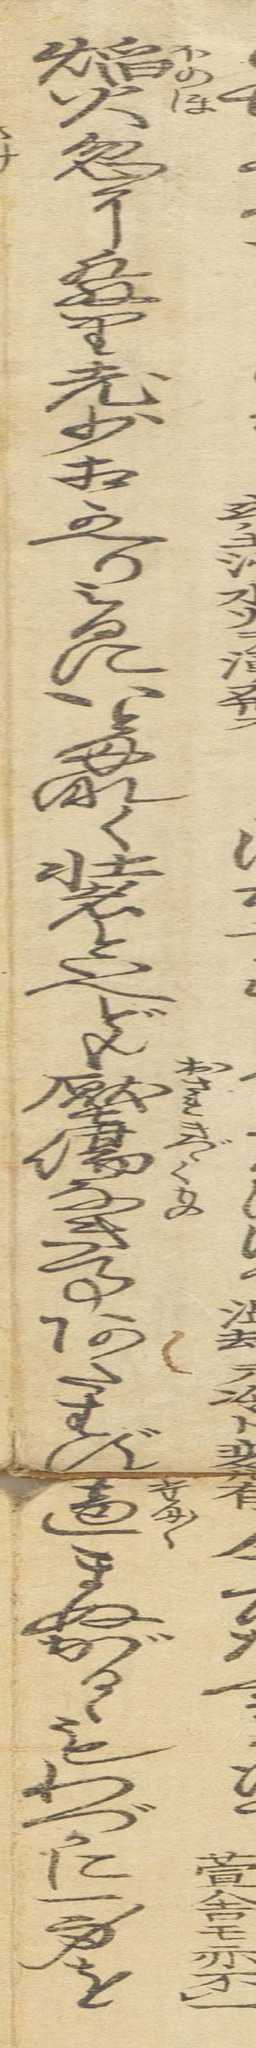焔火忽に発り老少相かへりみるにいとまなく壮者といへども壓傷なき事あたはず適まぬがるゝもわづかに一身を
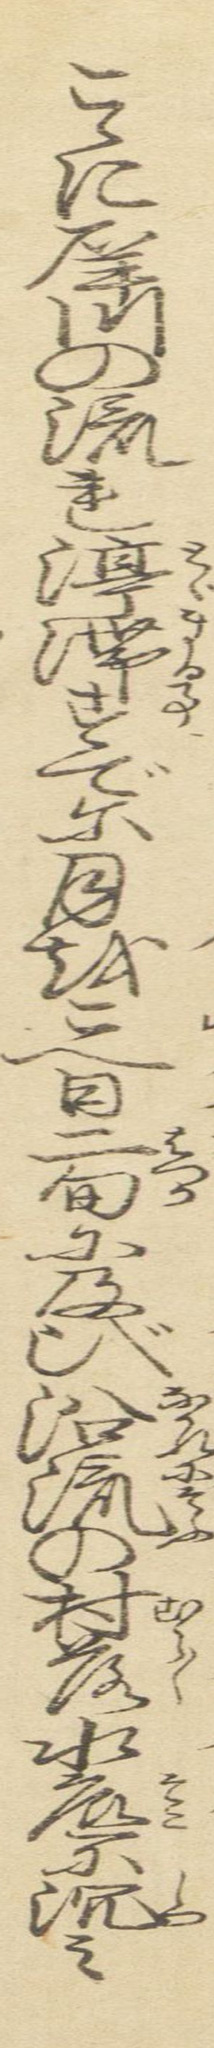こゝに犀川の流れ停滞すでに月をこへ日二旬に及び沿流の村落水底に沈み
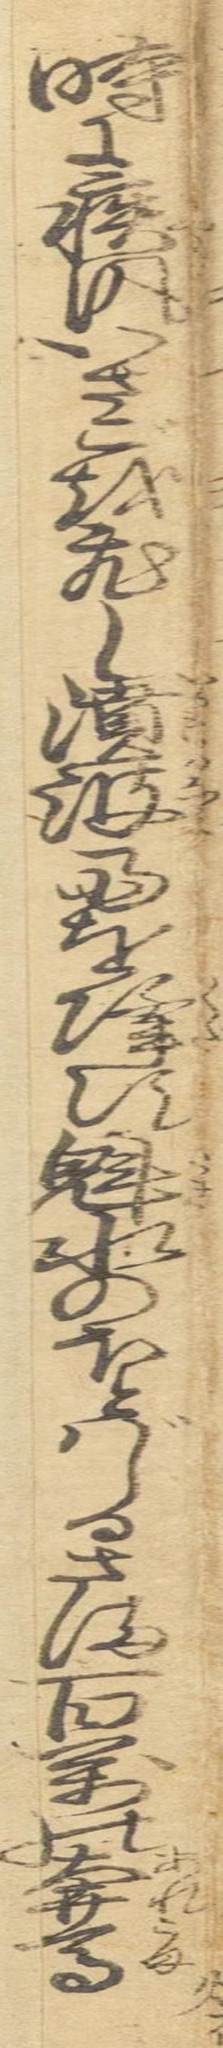時に療風いさこを尤し潰波雨を降す魁水のおとつるさま百万の奔馬
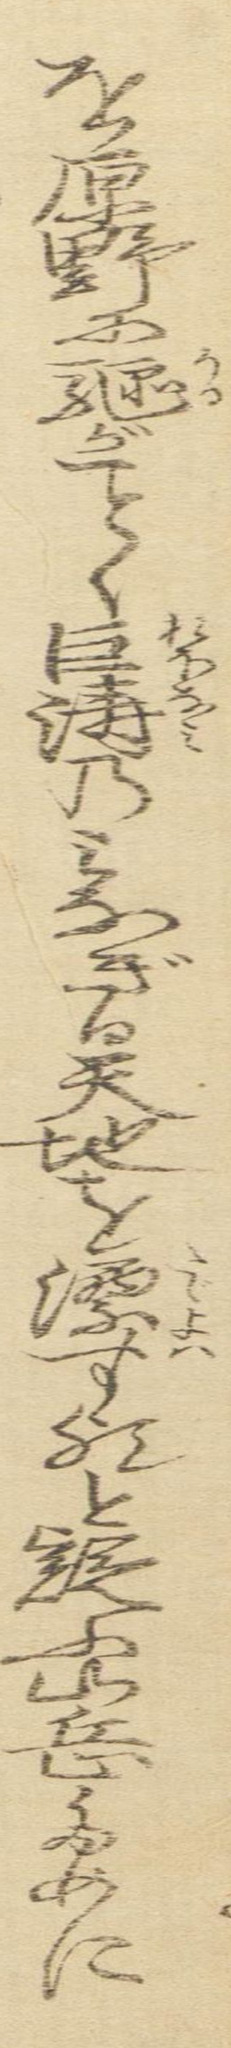を原野に驅がことく巨濤のみなぎる天地を漂す歟と疑ふ山岳ために
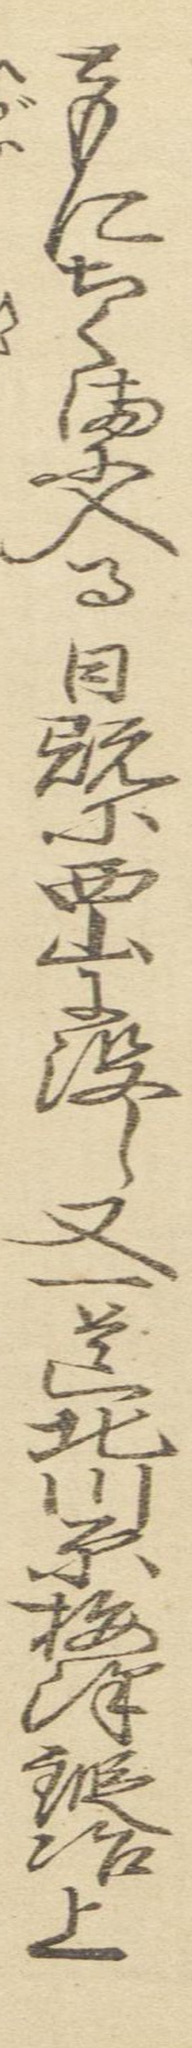ともにちくまに入る日既に西山に没し又一道北川原梅津鍛治上
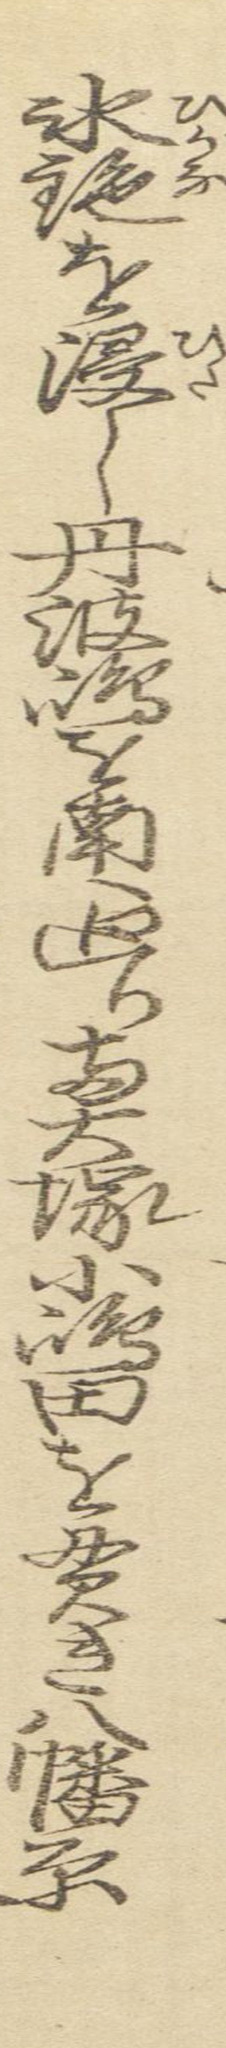氷鉋を浸し丹波島嶋を南へ廻り兩大塚小嶋田を貫き八幡原
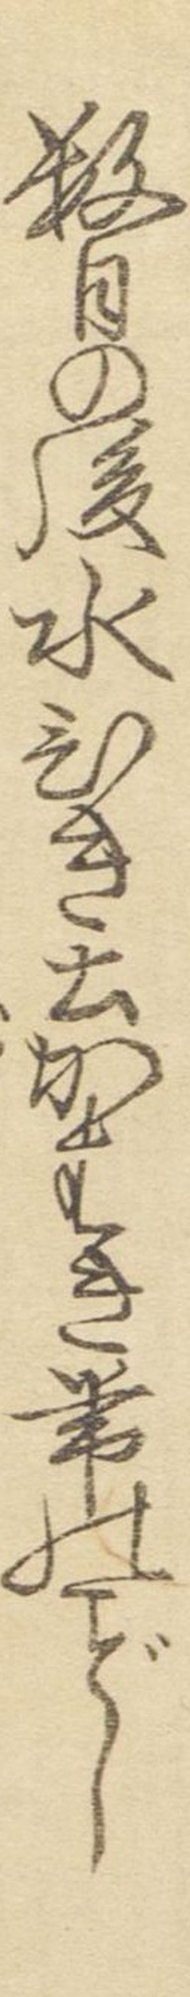数日の後水ひき土かはき常のことし
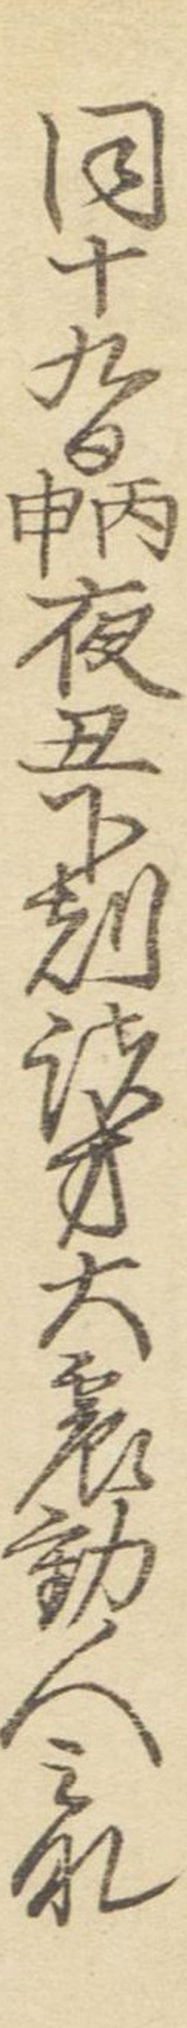同十九日丙申夜丑下刻諸方大震動人みな
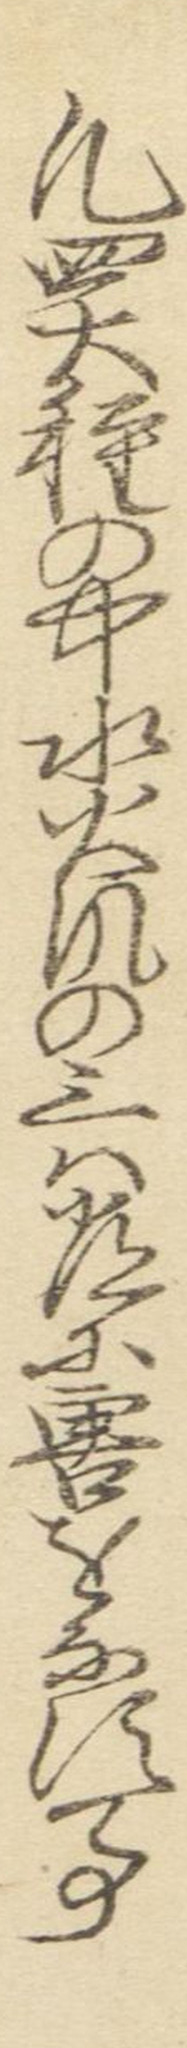凡四大種の中水火風の三は常に害をなす事
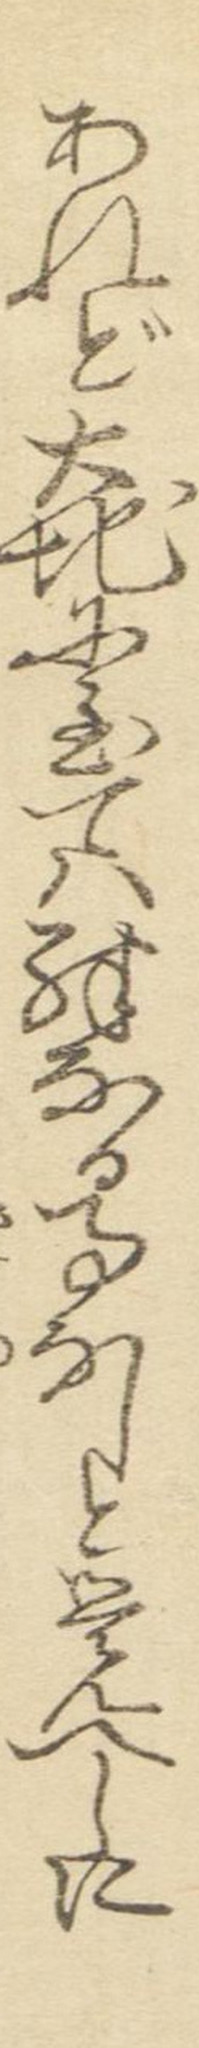あれど大地に至ては殊なる事なしと覚へしに
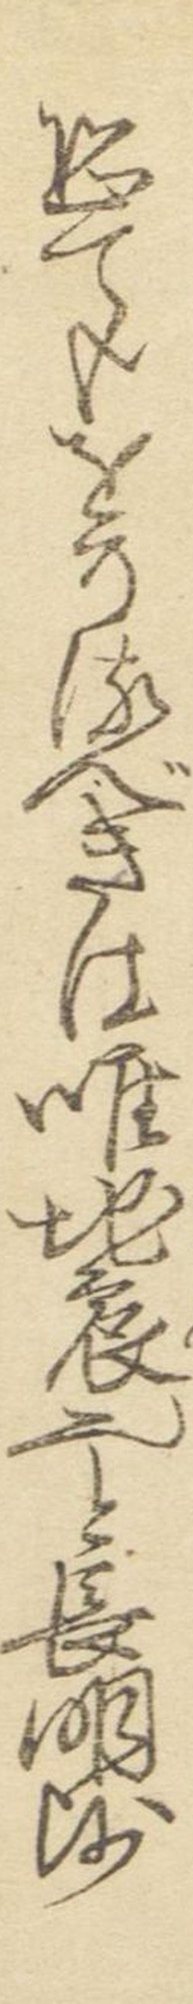恐てもヲ売るべきは唯地震也と長明頃
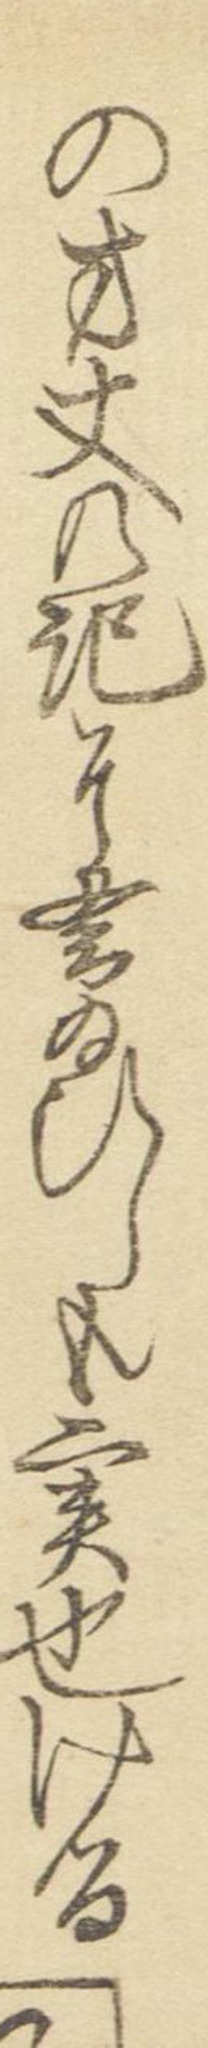の方丈記に書給ひしも実也ける
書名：丁未犀川漲激六郡漂蕩之圖　一鋪
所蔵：東京大学地震研究所図書室 Earthquake Research Institute Library, The University of Tokyo, JAPAN
